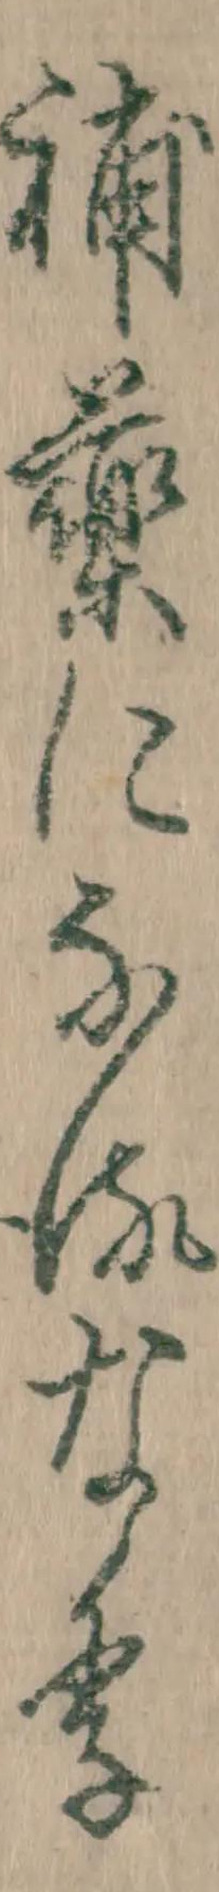補薬にな流な季
